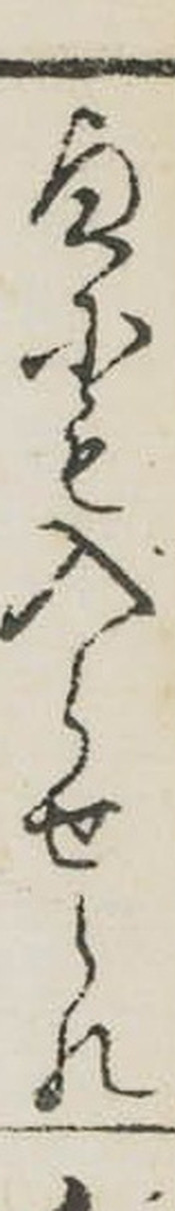さまにも入らせられ
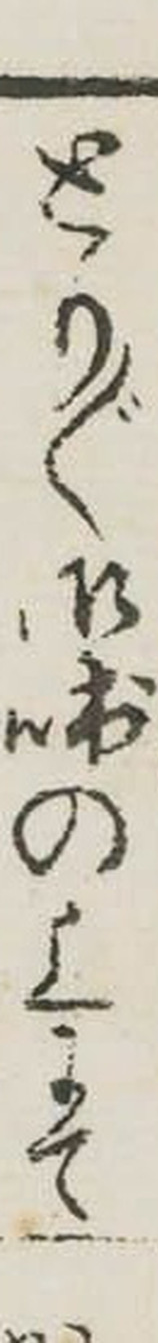とり〴〵御咄の上にて
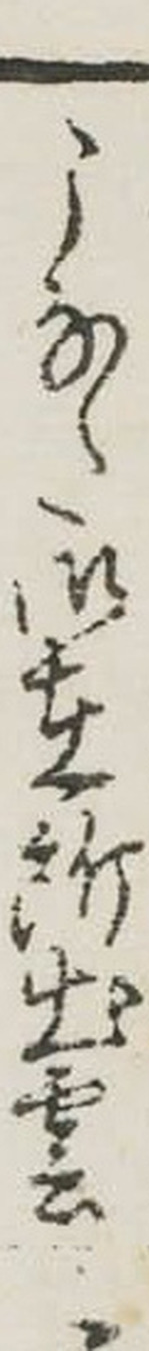こなた御在所出雲
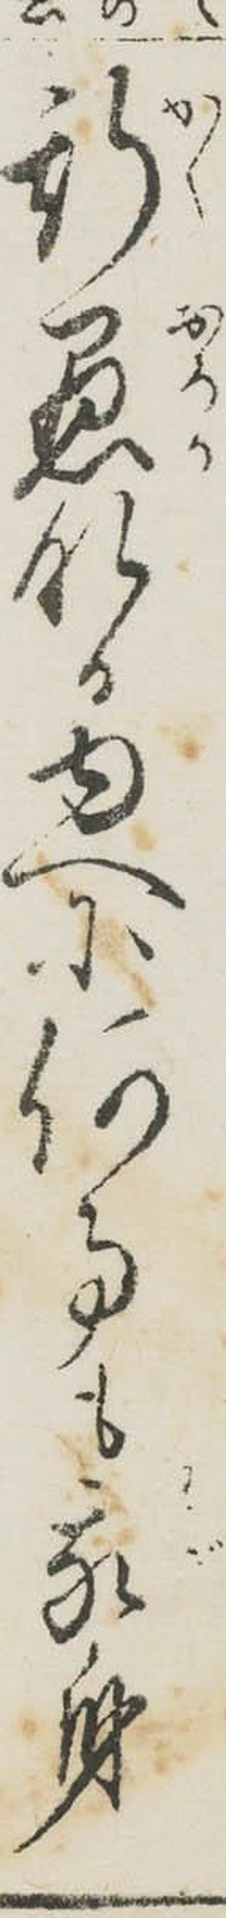斯愚なるゆへに何事も我身
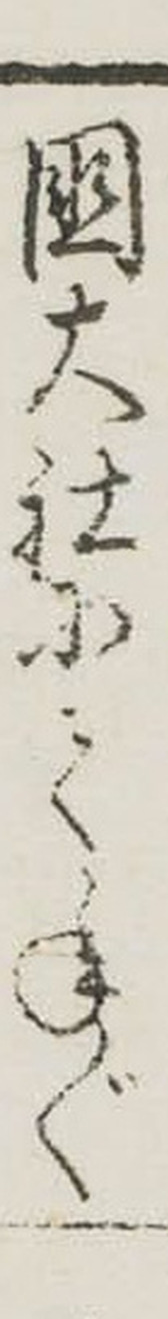国大社にて年〴〵
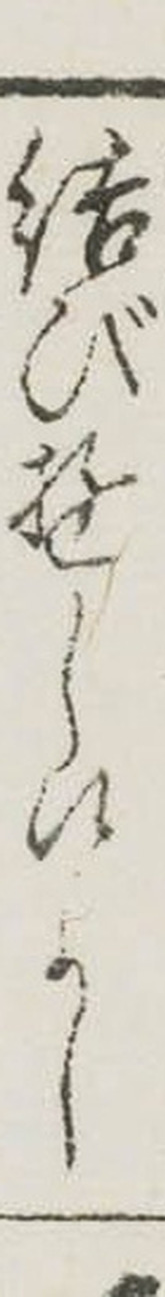結び遊し候よし
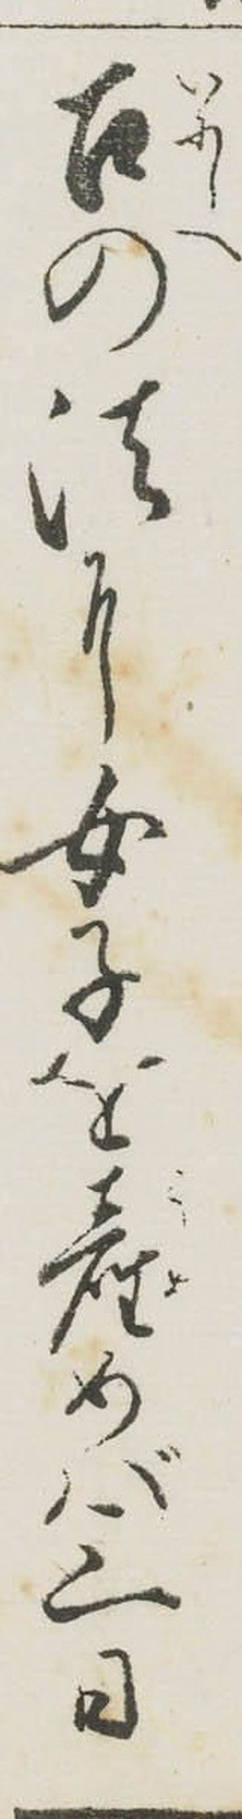古の法に女子を産めば三日
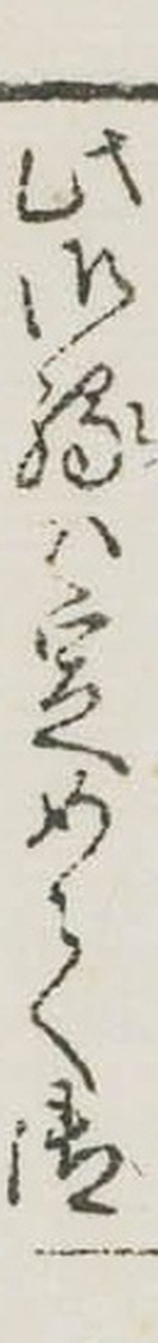此御縁は定めて御
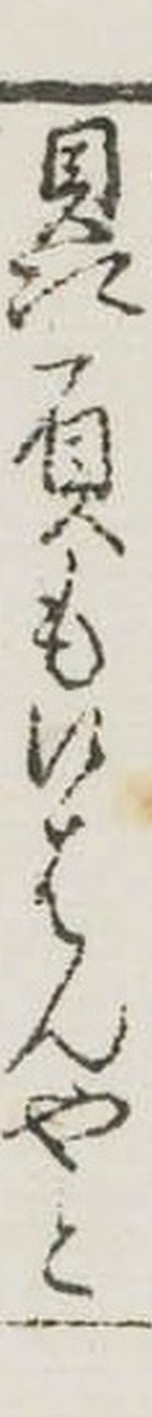贔屓も候はんやと
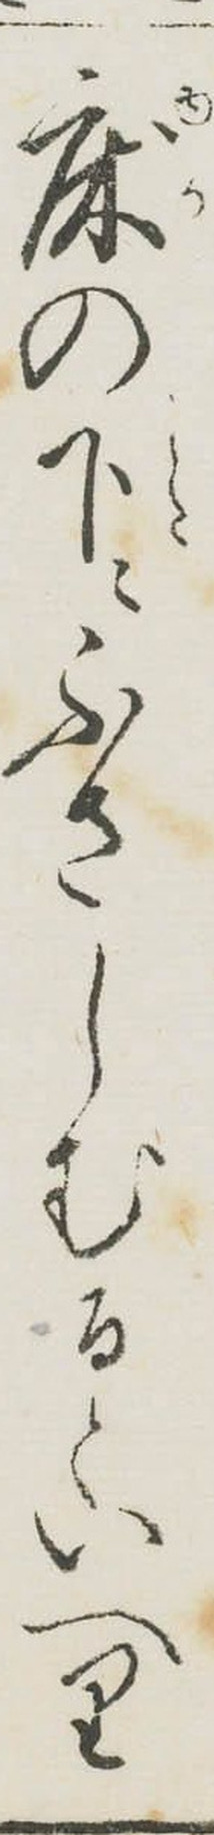床の下ふさしむるといへり
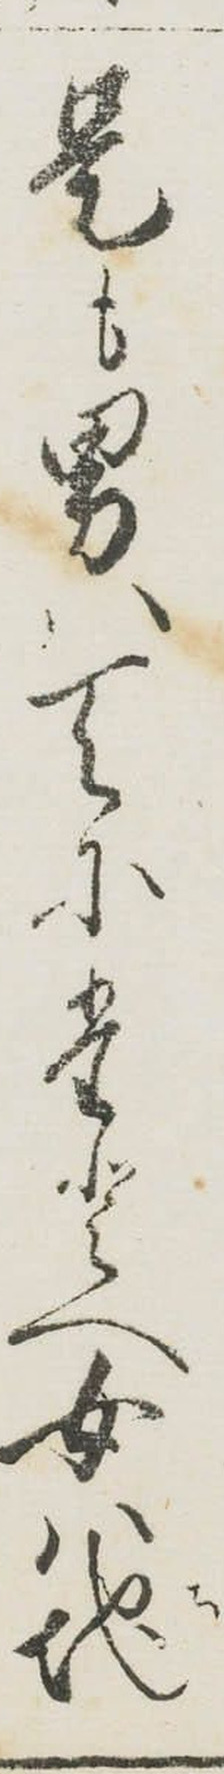是も男は天にたとへ女は地
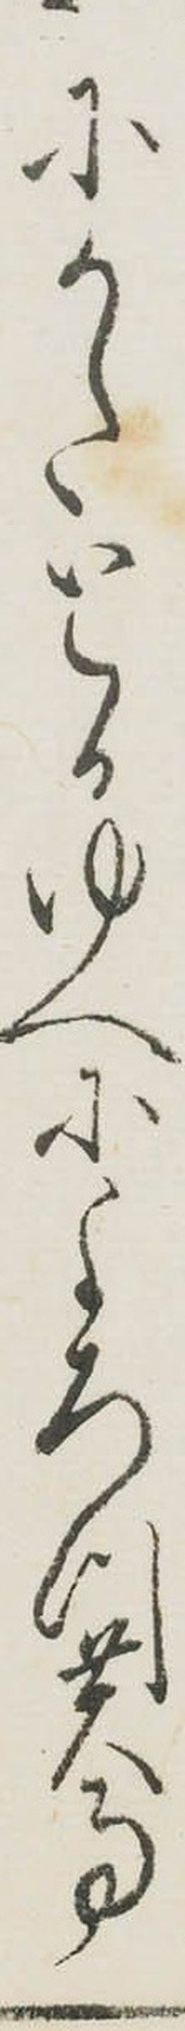にかたとるゆへによろつの事
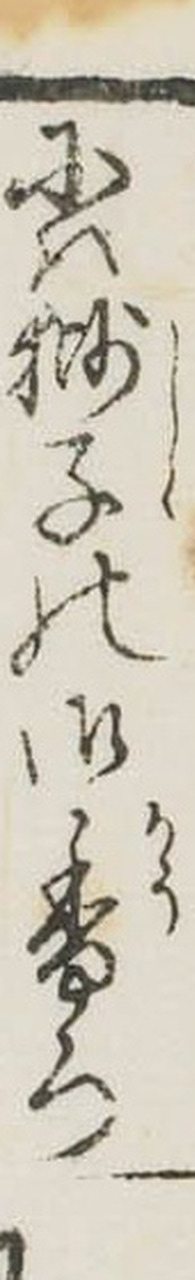には獅子の御香ろ
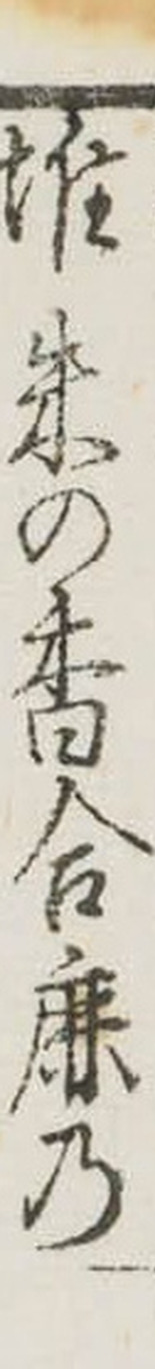堆朱の香合鹿の
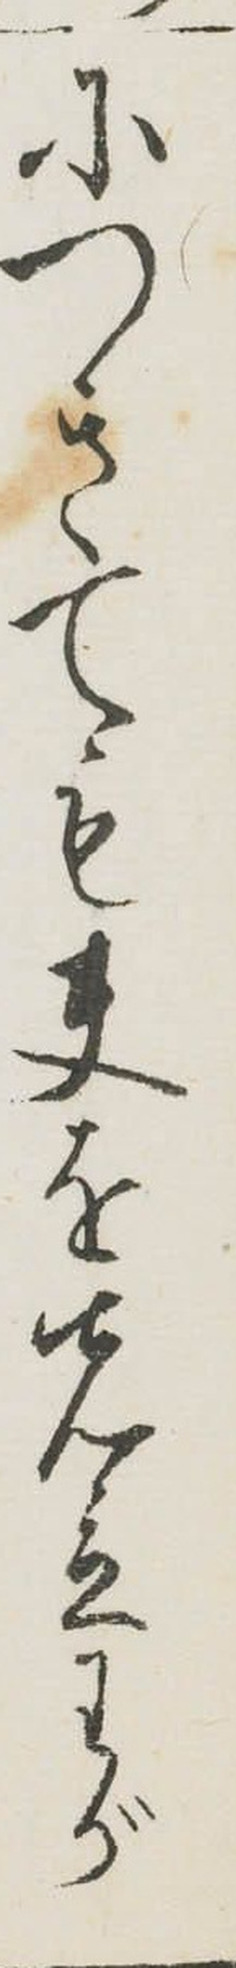につきても夫を先立わが
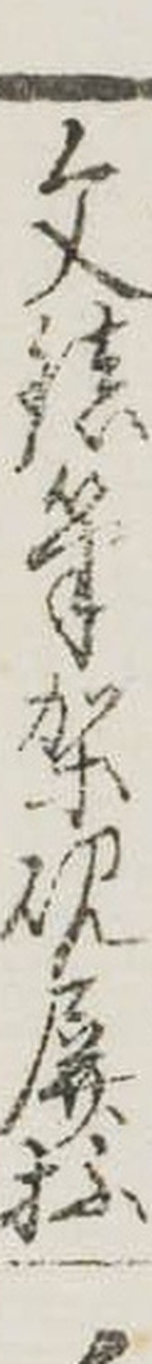文鎮筆架硯屏抔
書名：女大学
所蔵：東京学芸大学教育コンテンツアーカイブ
